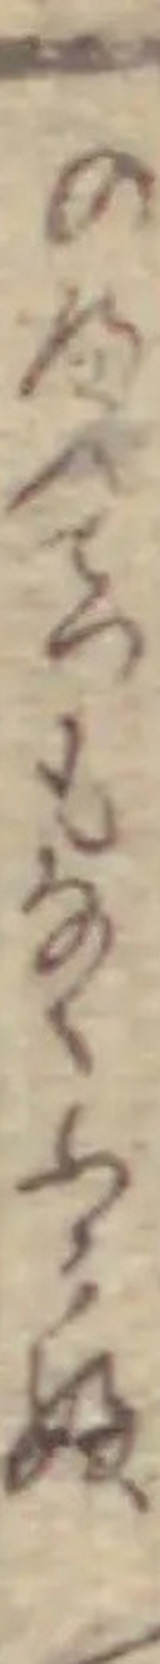のへんてつもなくふうふ
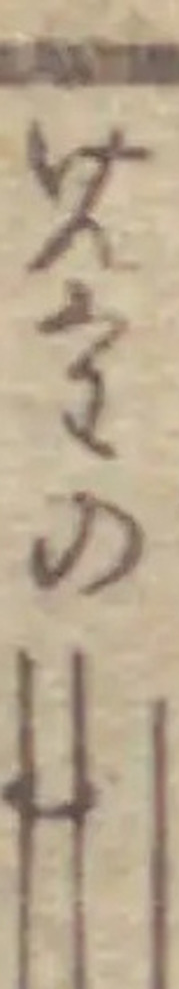けんくわの
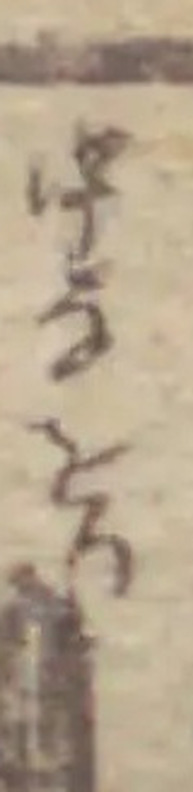中なをり
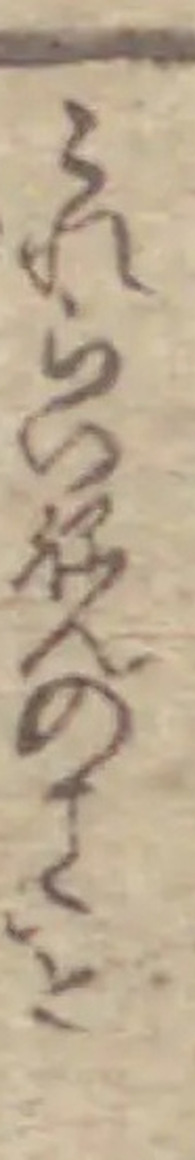これらいねんのことを
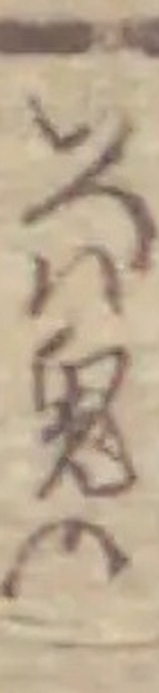いへは鬼の
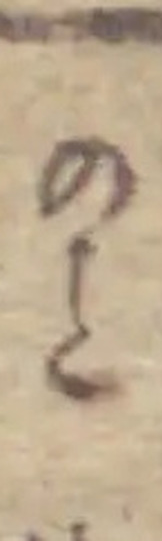のこと

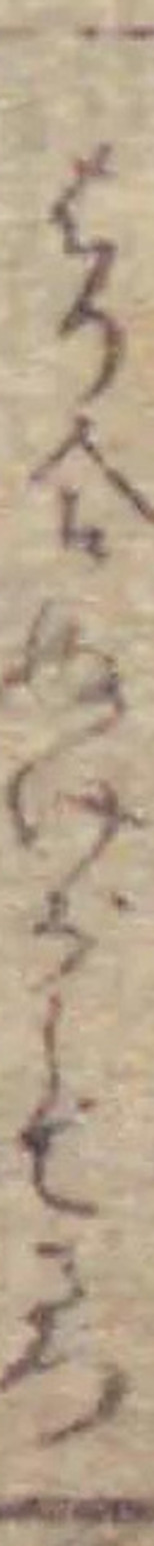はり合ぬけ少してさつ
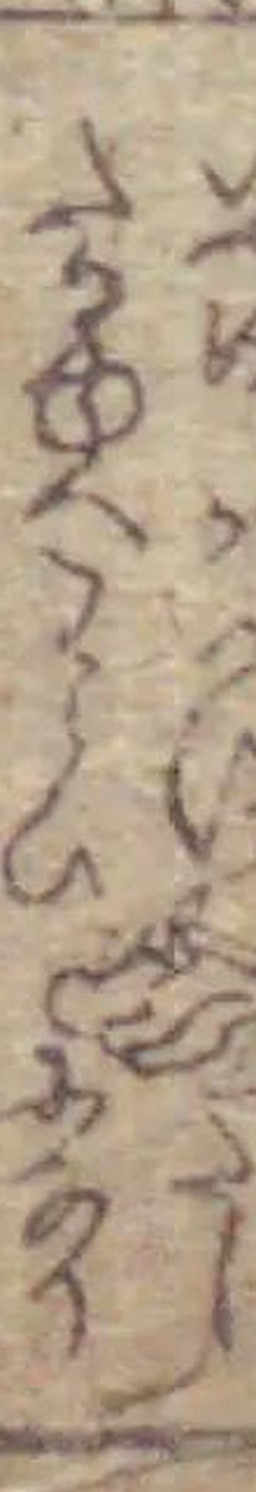たるゆへわらひになり
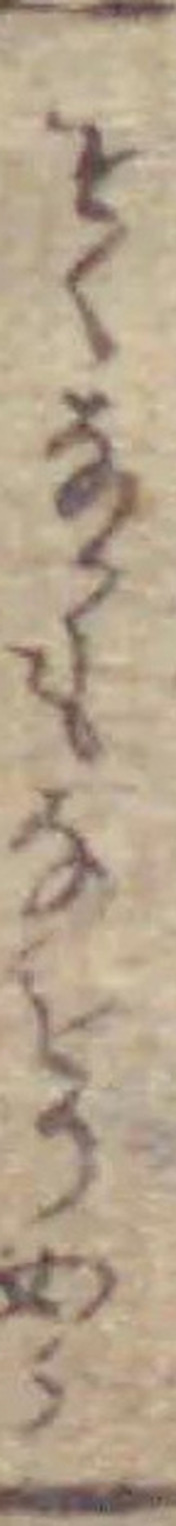そくなかもなをり女郎
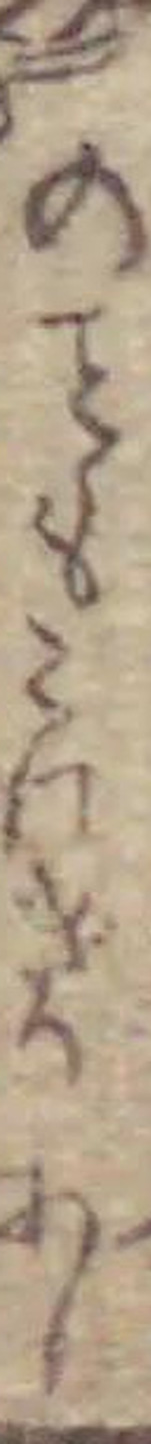のこともこれぎりにし
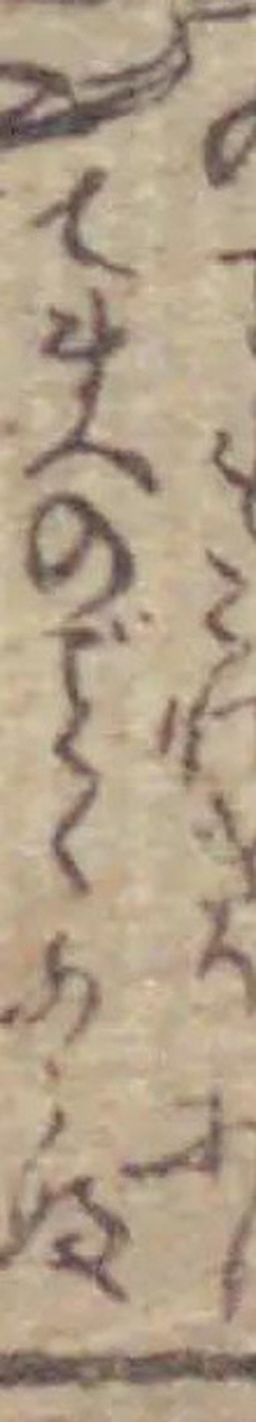てまへのごとくふうふ
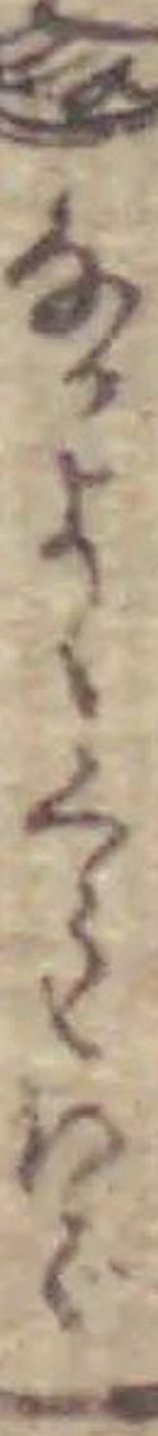なかよくくらしほど
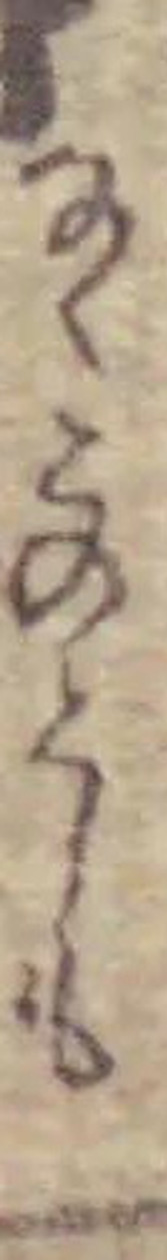なくこのとしも
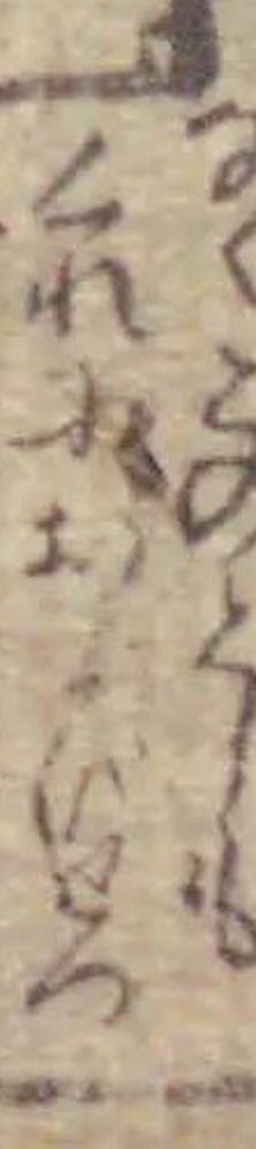くれにおよびせつ
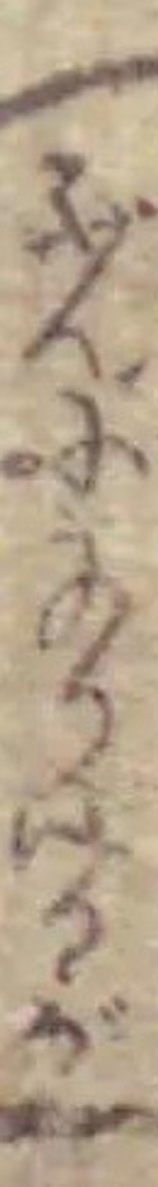ぶんになりけるが
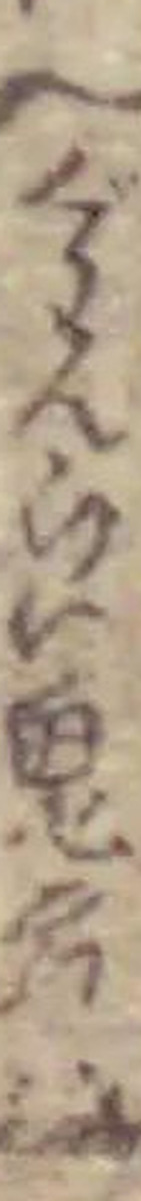ぐわんらい鬼市
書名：鬼子宝 3巻
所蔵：国立国会図書館 National Diet Library, JAPAN
